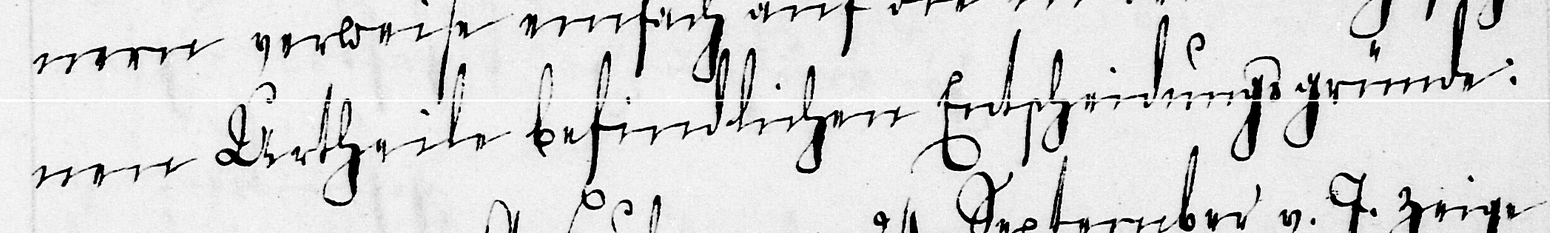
nen Urtheile befindlichen Entscheidungsgründe:
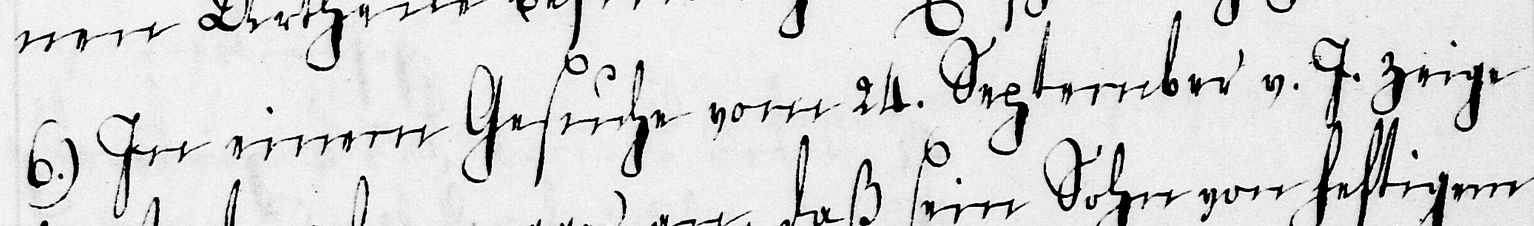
6.) In einem Gesuche vom 24. September v. J. zeige
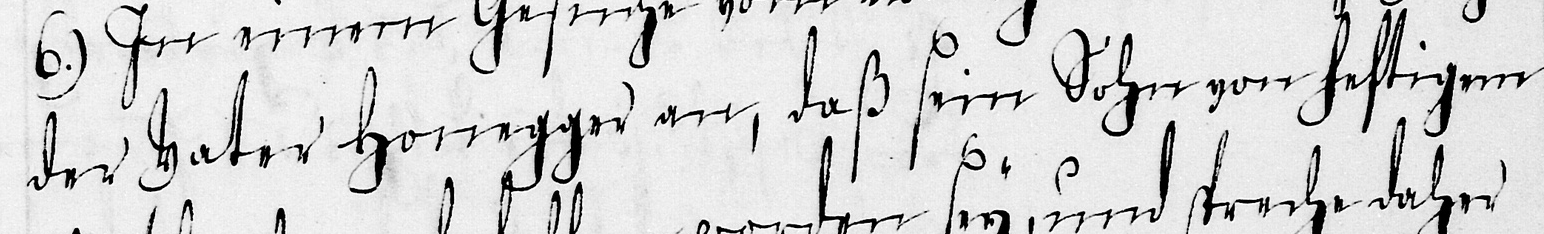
der Vater Honegger an, daß sein Sohn von heftigem
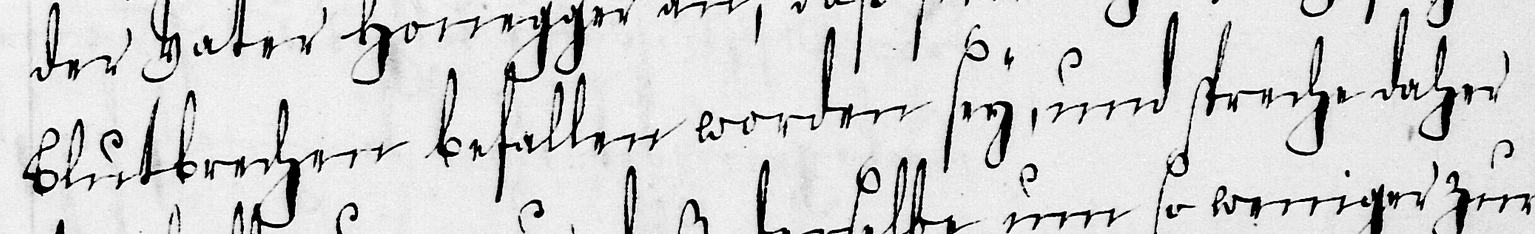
Blutbrechen befallen worden sey, und spreche daher
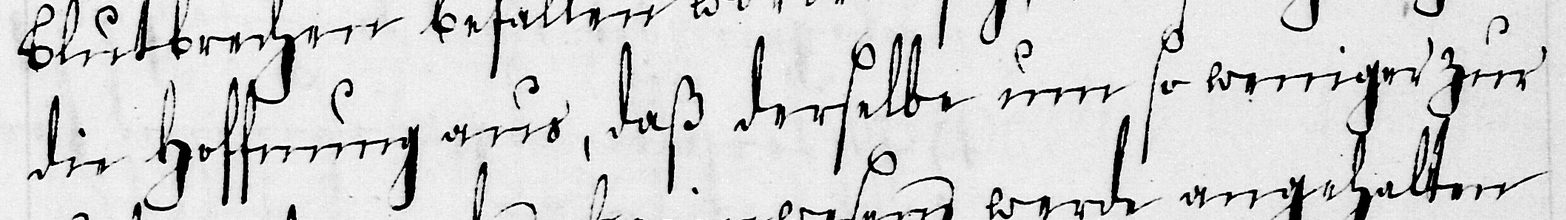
die Hoffnung aus, daß derselbe um so weniger zur
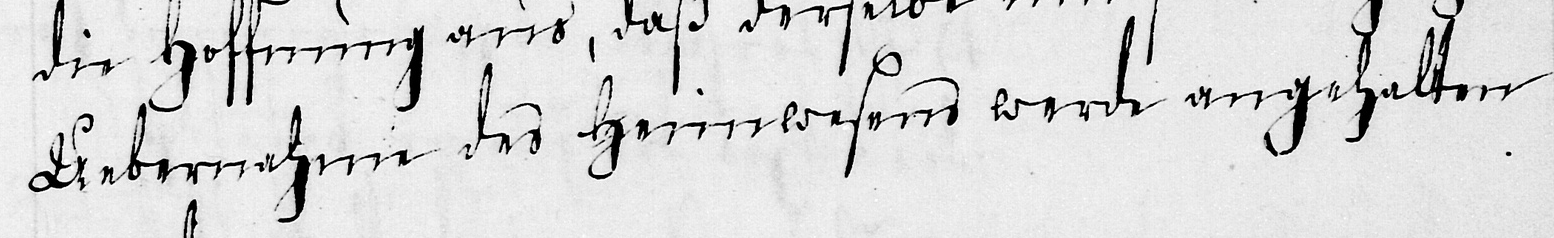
Uebernahme des Heimwesens werde angehalten
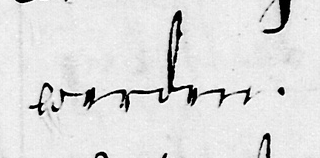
werden.
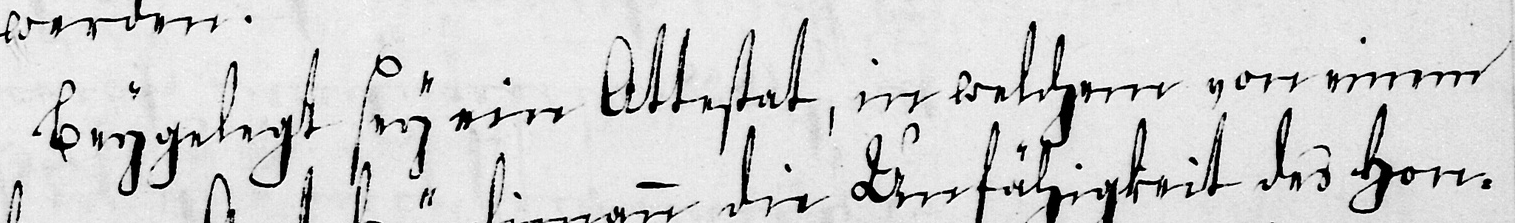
Beygelegt sey ein Attestat, in welchem von einem
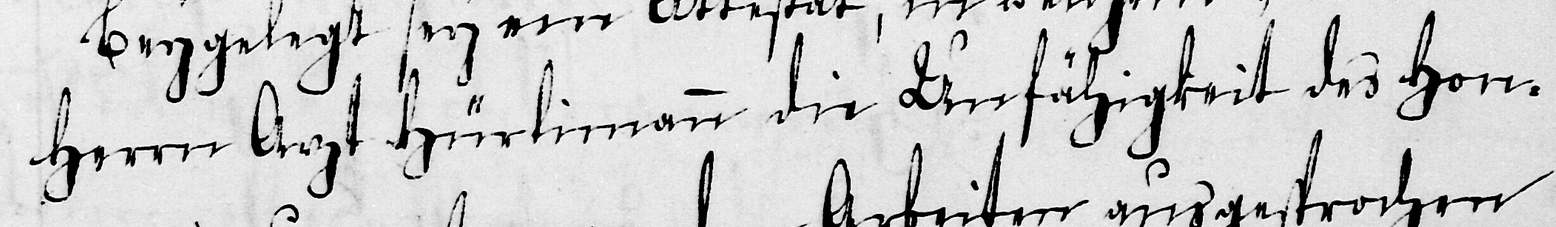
Herrn Arzt Hürlimann die Unfähigkeit des Hon¬
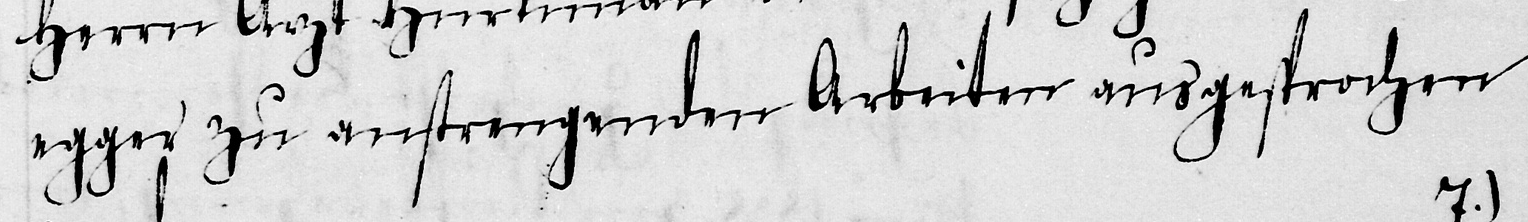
egger zu anstrengenden Arbeiten ausgesprochen
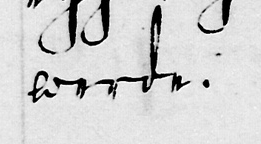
werde.
